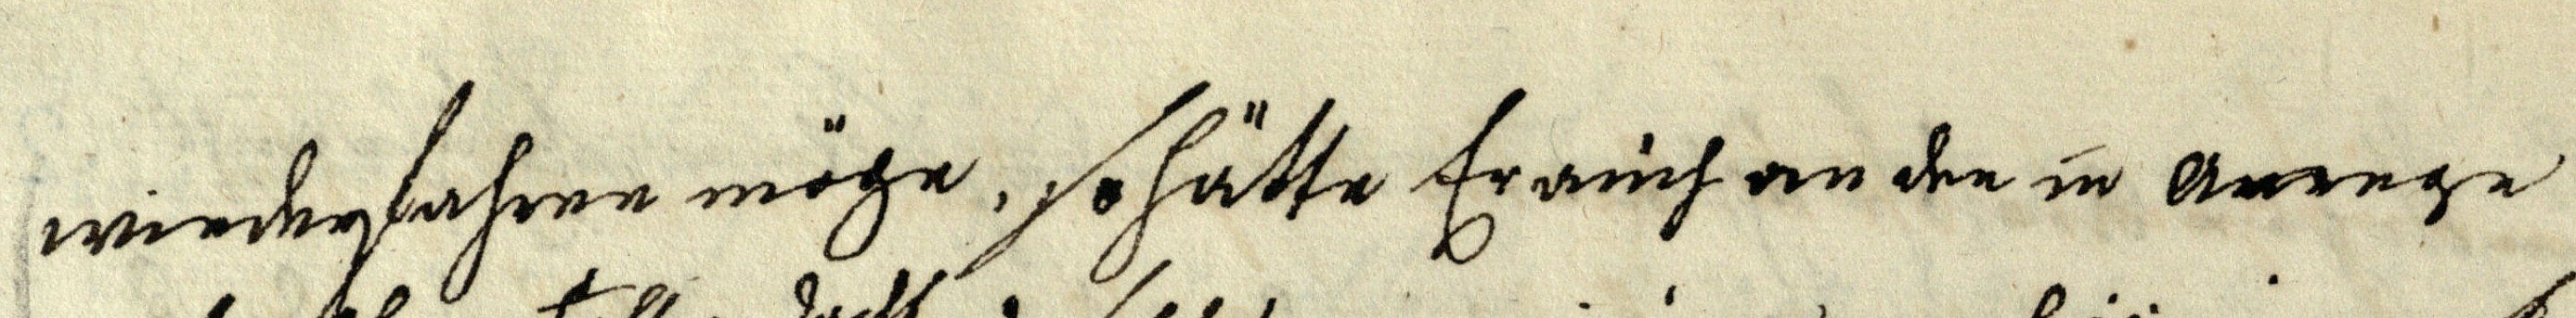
wiederfahren möge, so hätte Er auch an den in Anrege
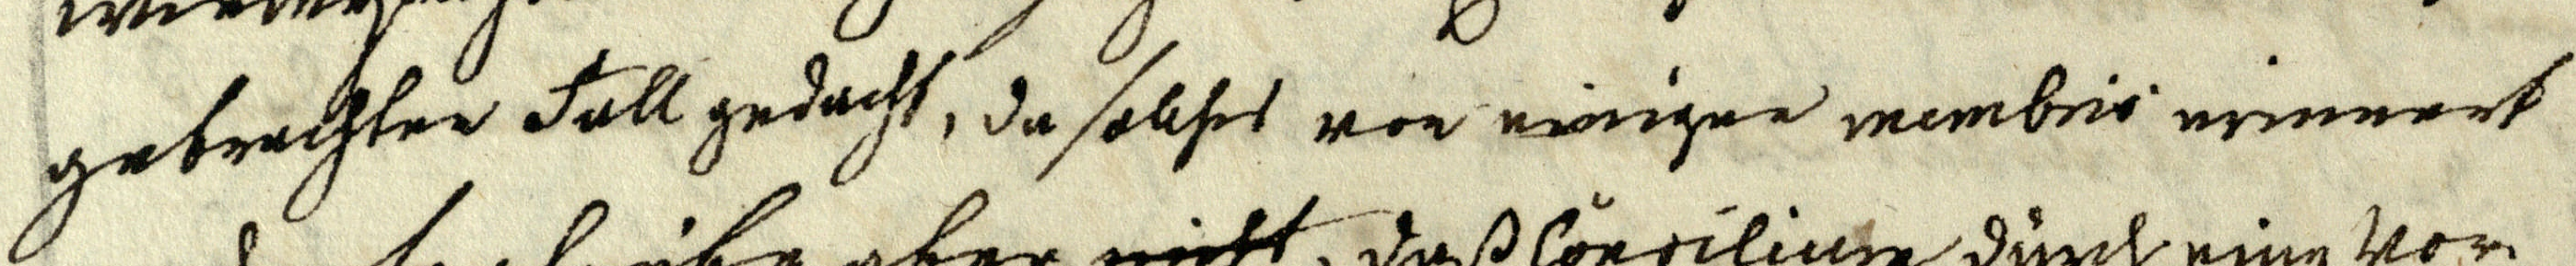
gebrachten Fall gedacht, da solches von einigen membris erinnert
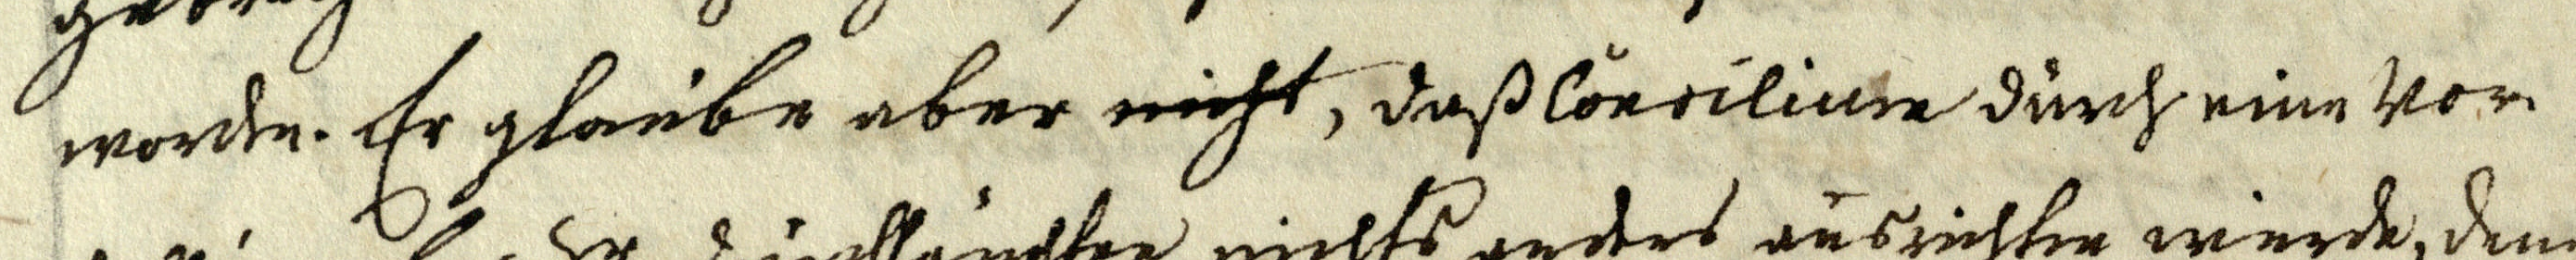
worden. Er glaube aber nicht, daß Concilium durch eine Vor¬
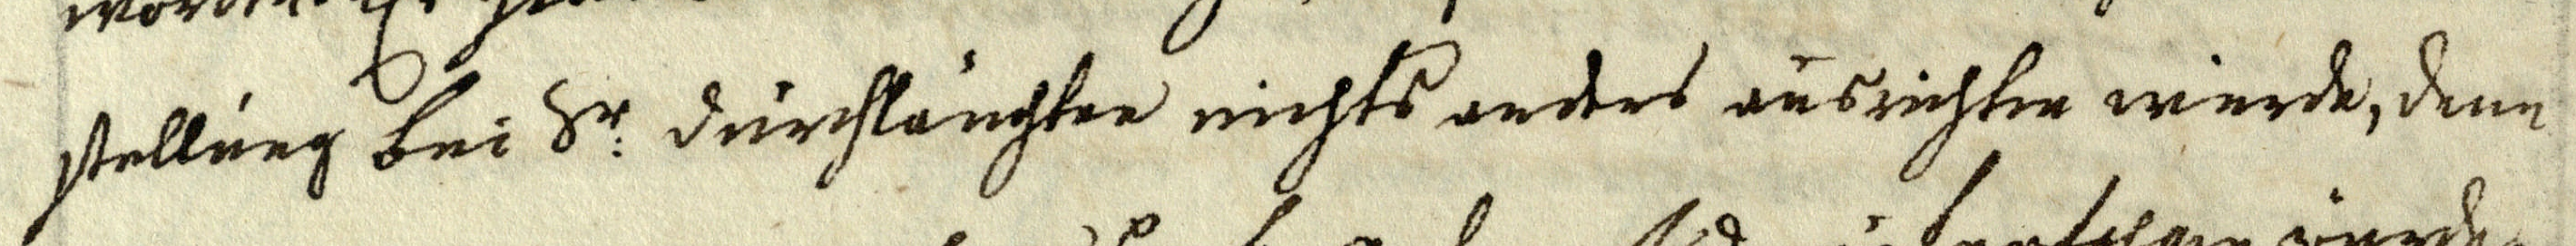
stellung bei Sr Durchlauchten nichts anders ausrichten werde, denn
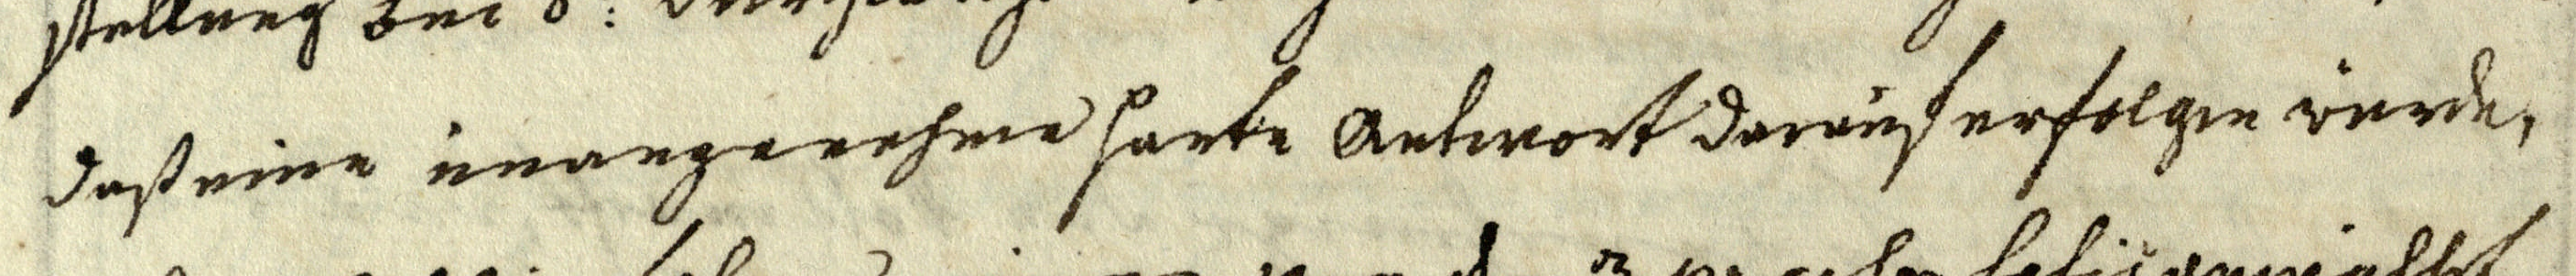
daß eine unangenehme harte Antwort darauf erfolgen würde,
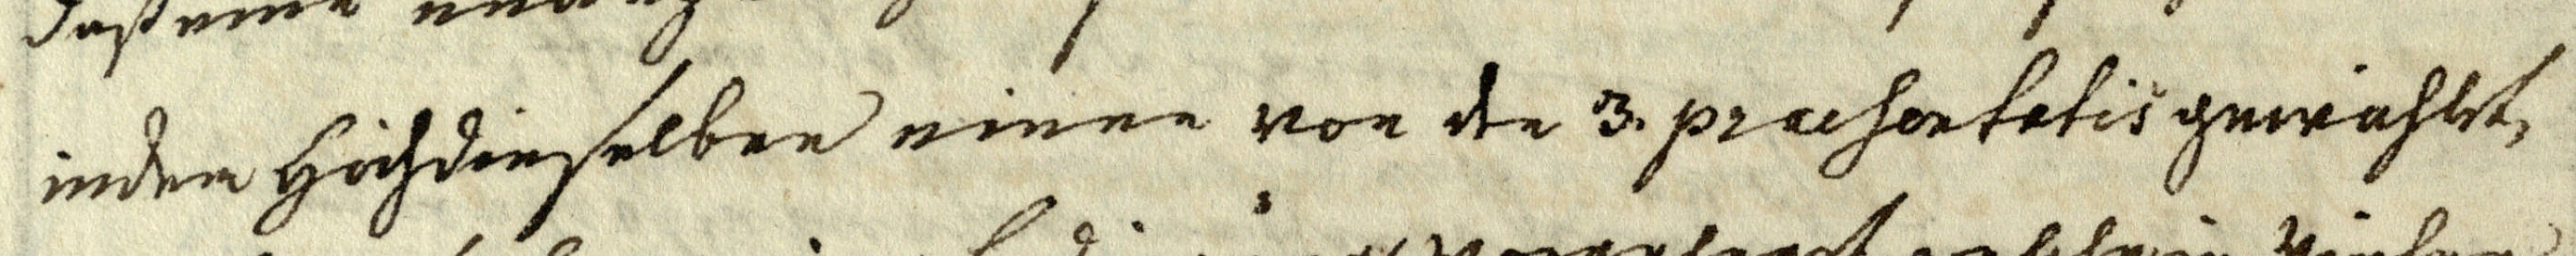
indem Hochdenselben einen von den 3. praesentatis gewählet,
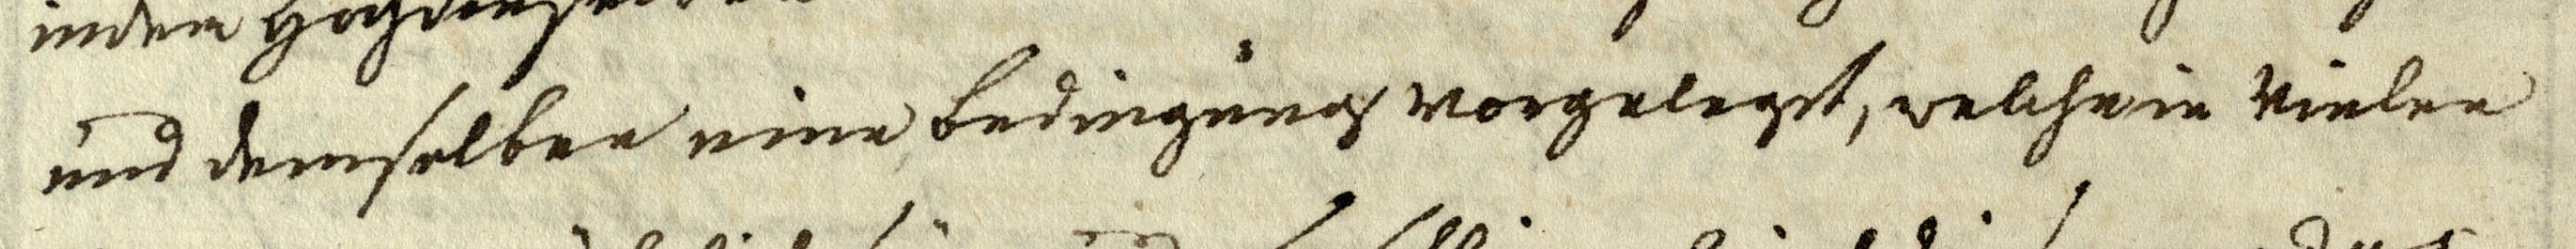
und demselben eine Bedingung vorgeleget, welchen vielen
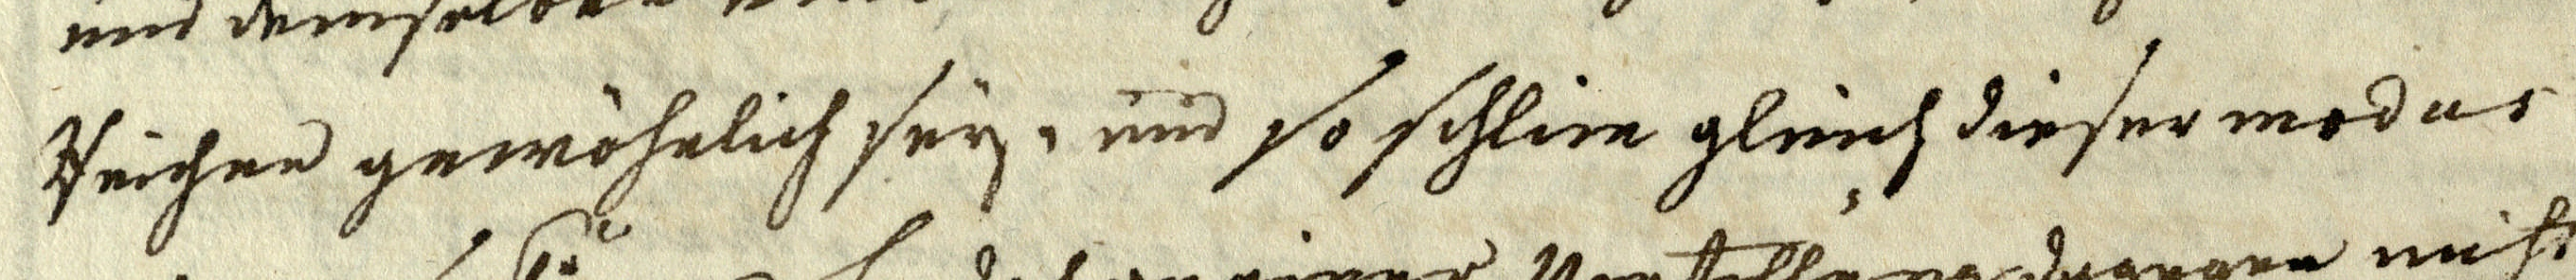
Reichen gewöhnlich seÿ und so schlim gleich dieser modus
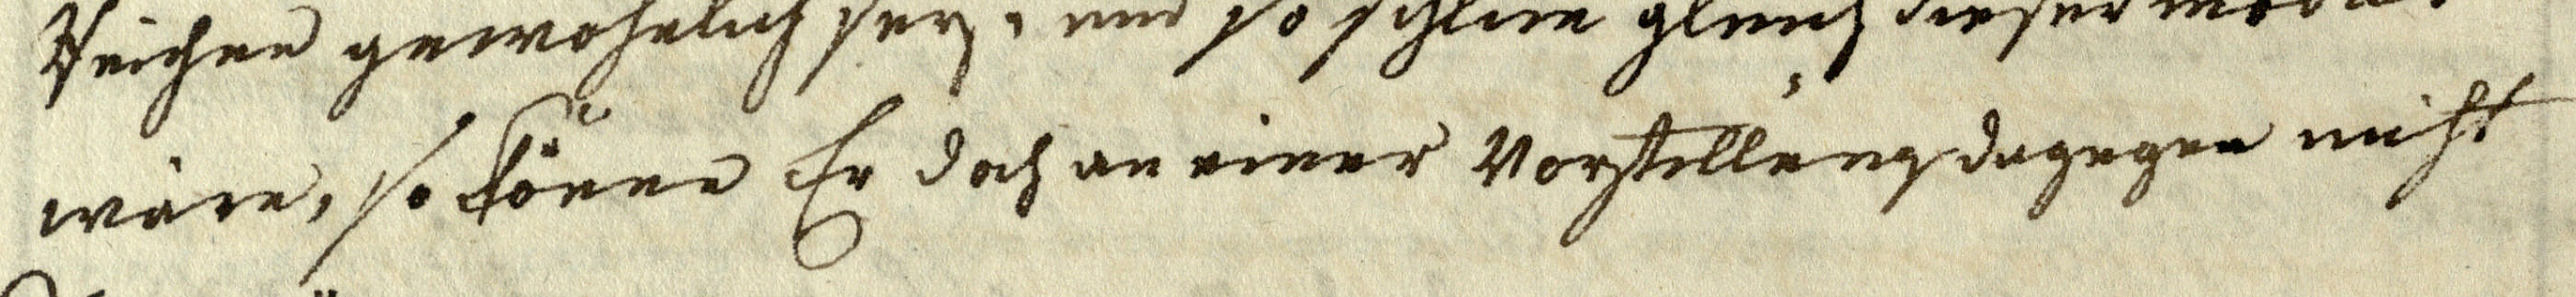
wäre, so könne Er doch an einer Vorstellung dagegen nicht
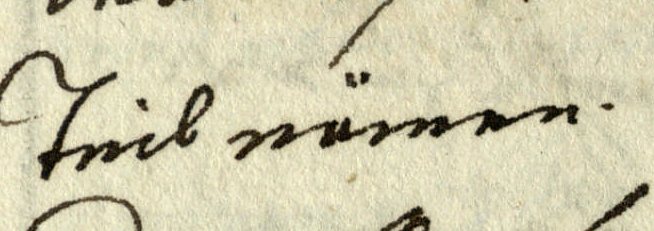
Teil nämen.
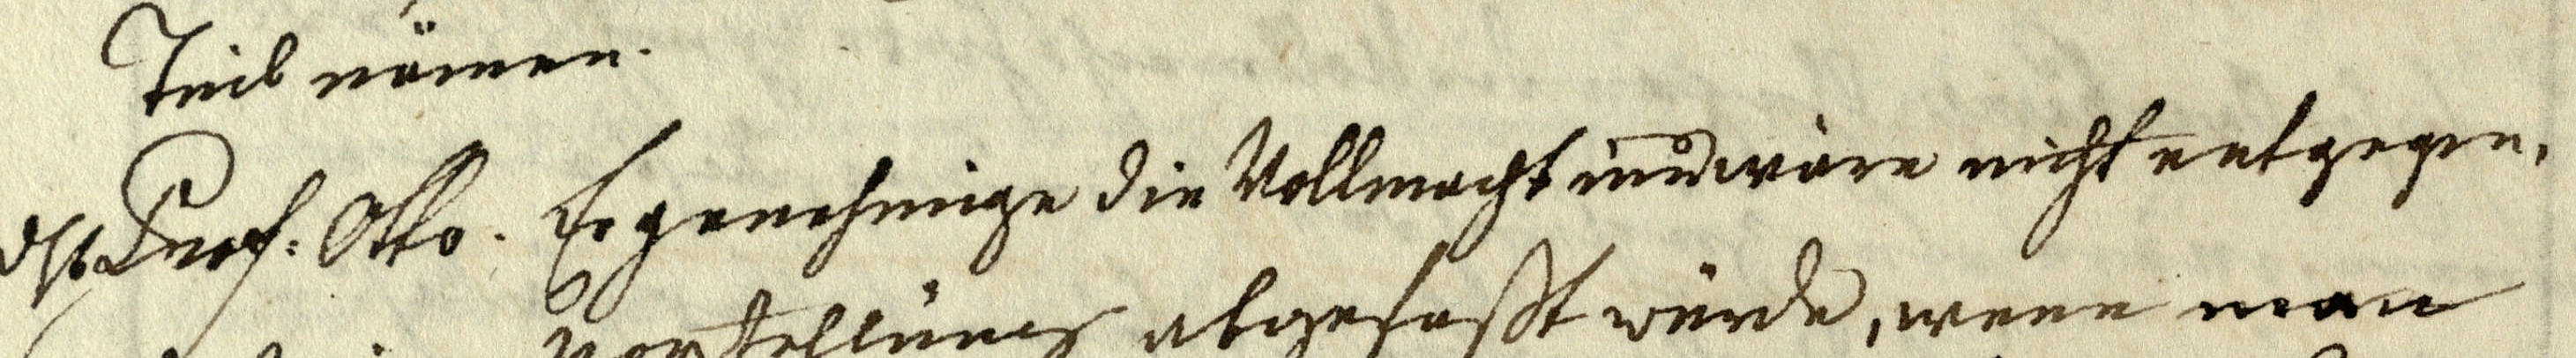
dh Prof. Otto. Er genehmige die Vollmacht und wäre nicht entgegen,
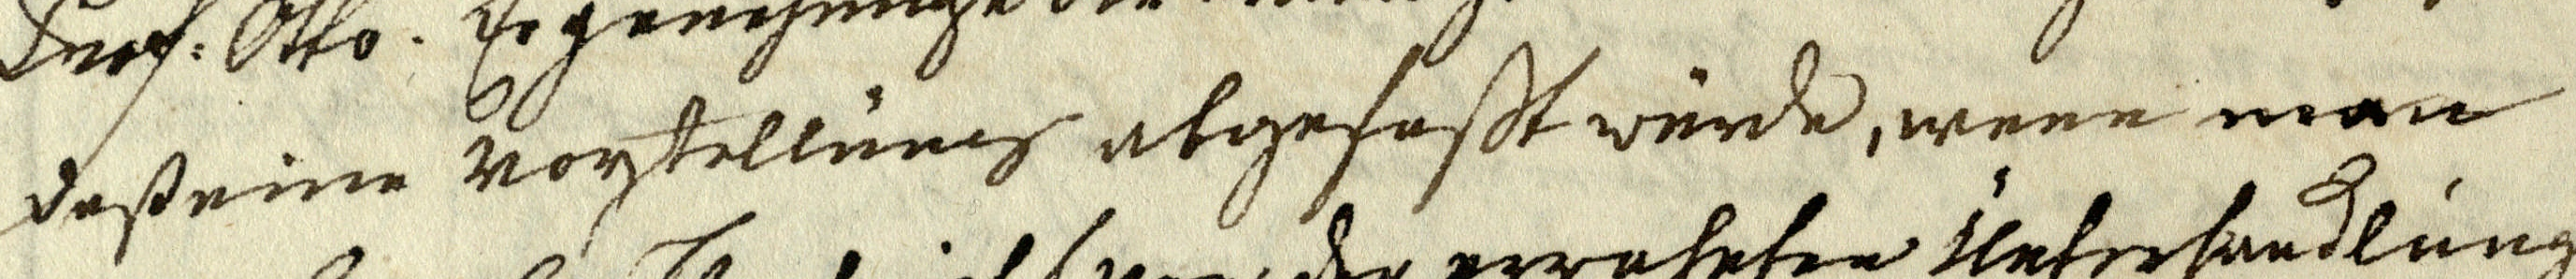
daß eine Vorstellung abgefaßt würde, wenn man
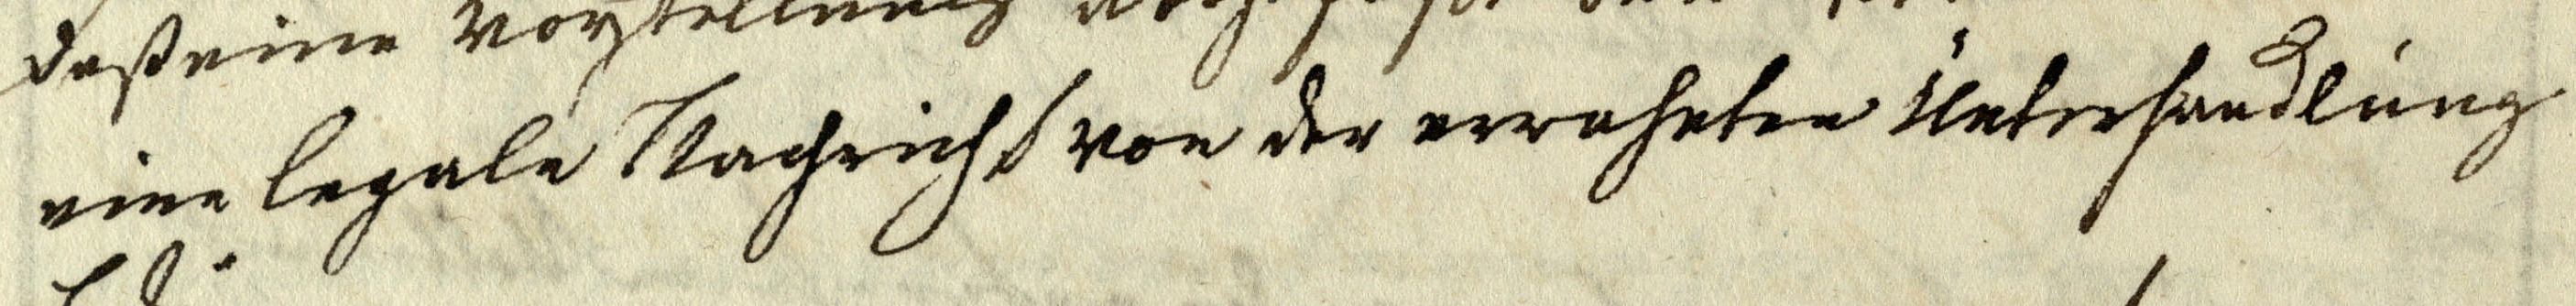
eine legale Nachricht von der erwähnten Unterhandlung
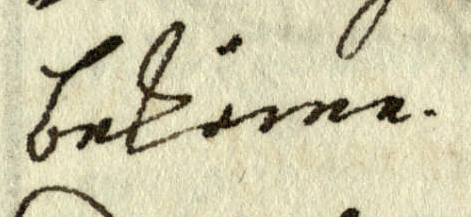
bekäme.
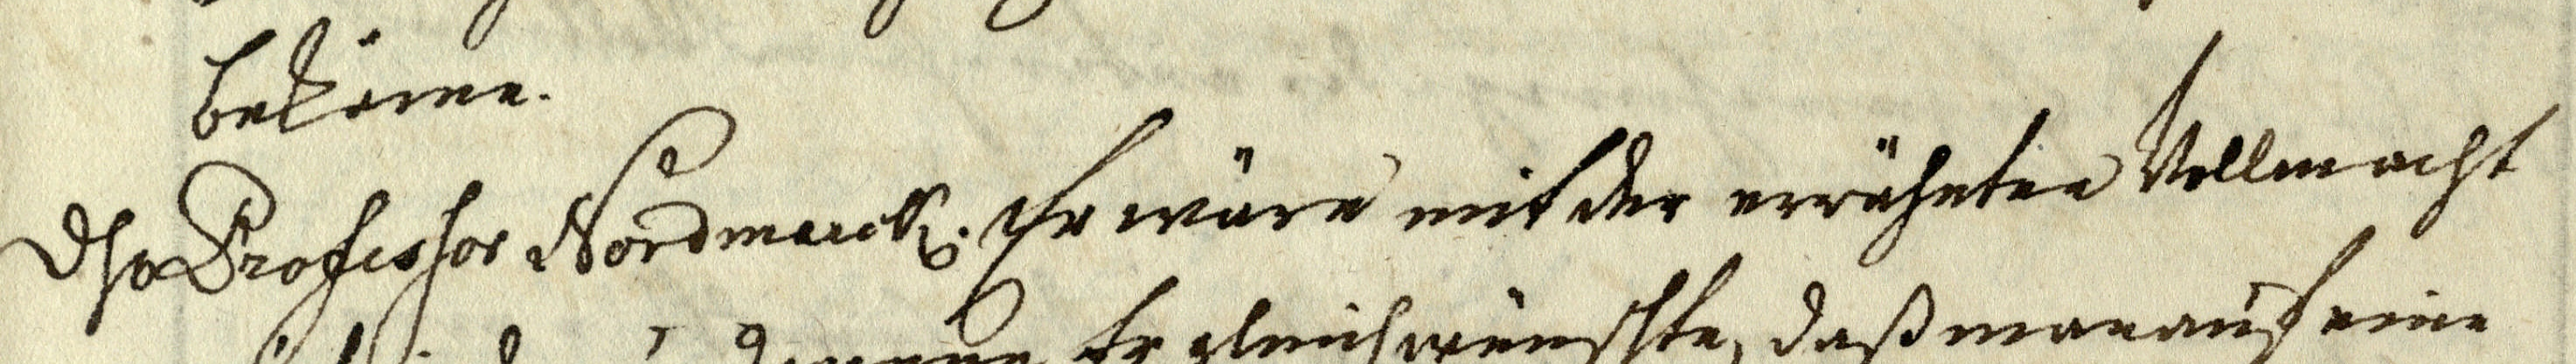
dh Professor Nordmarck. Er wäre mit der erwähnten Vollmacht
